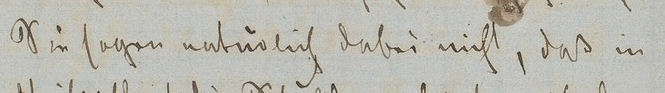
Sie sagen natürlich dabei nicht, daß in
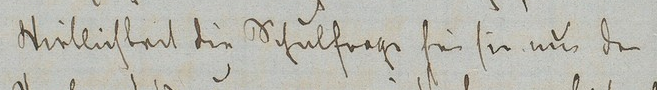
Wirklichkeit die Schulfrage für sie nur der
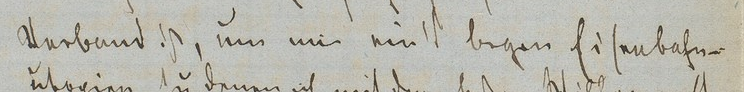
Vorwand ist, um mir ein's wegen Eisenbahn-
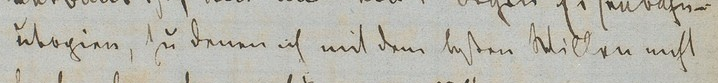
utopien, zu denen ich mit dem besten Willen nicht
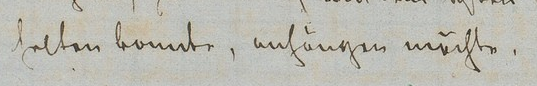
halten konnte, anhängen möchte.
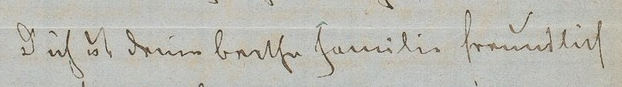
Dich u. deine werthe Familie freundlich
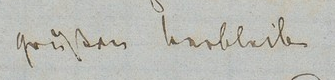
grüßen verbleibe
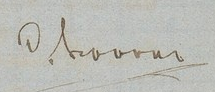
C. Karrer
